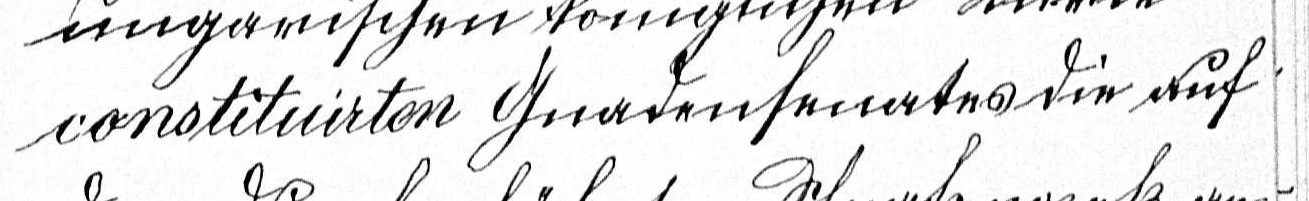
constituirten Gnadensenates die auf
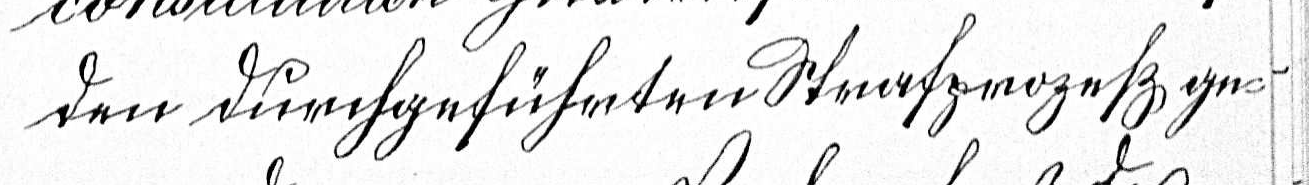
den durchgeführten Strafprozeß ge¬
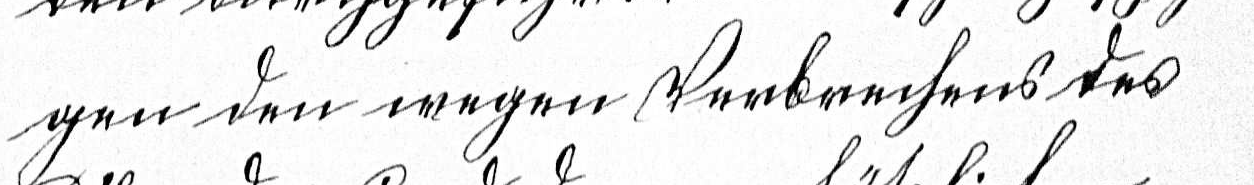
gen den wegen Verbrechens des
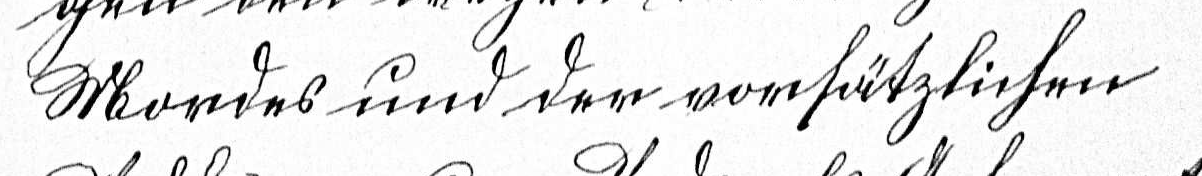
Mordes und der vorsätzlichen
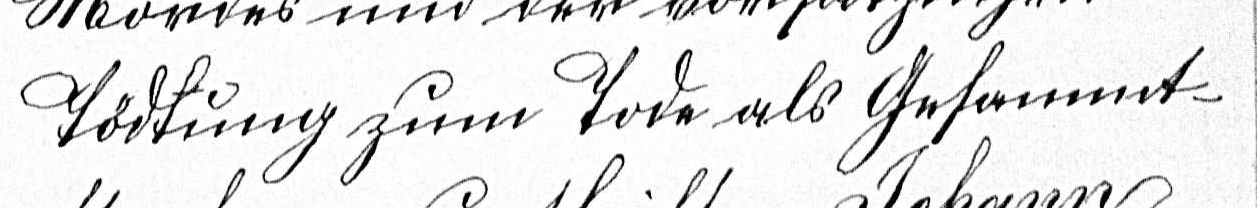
Tödtung zum Tode als Gesammt¬
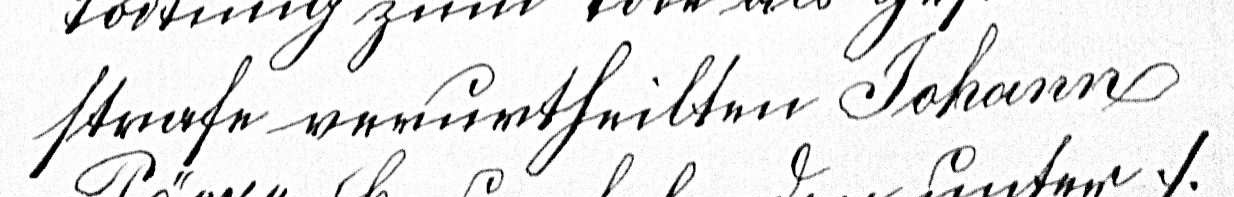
strafe verurtheilten Johann
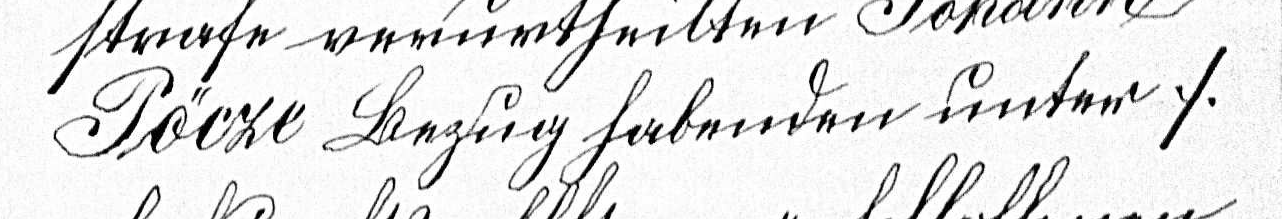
Pöcze Bezug habenden unter %
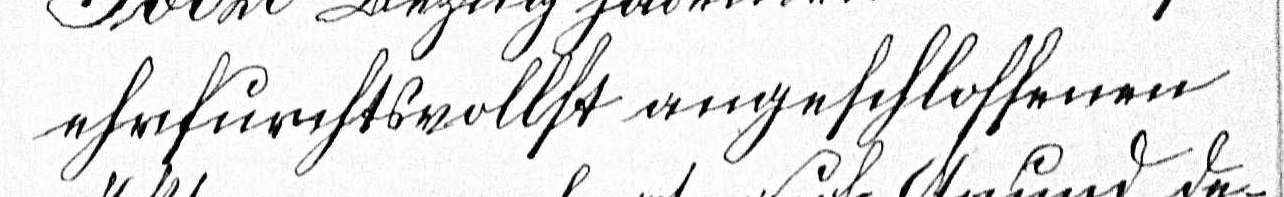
ehrfurchtsvollst angeschlossenen
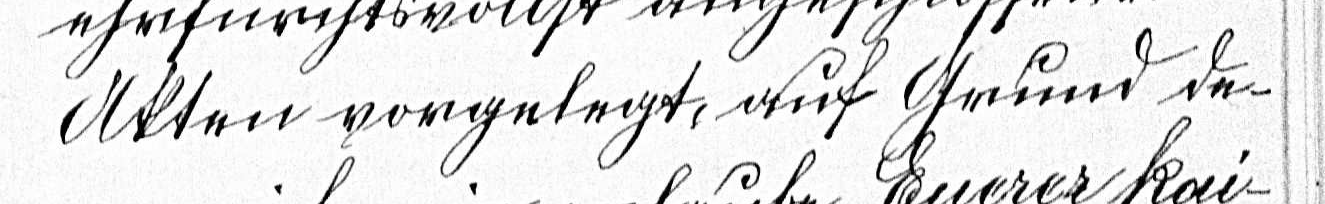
Akten vorgelegt, auf Grund de¬
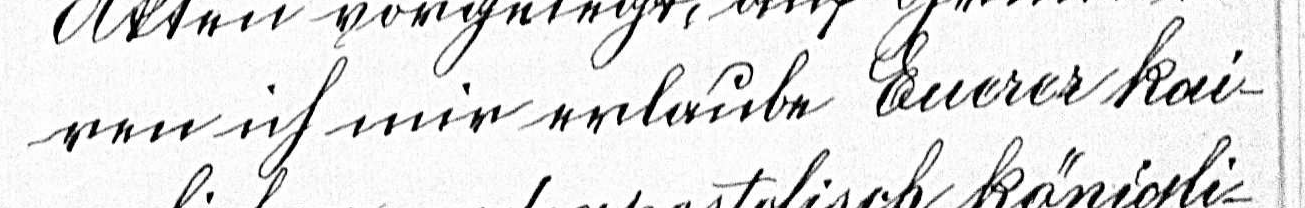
ren ich mir erlaube Euerer kai¬
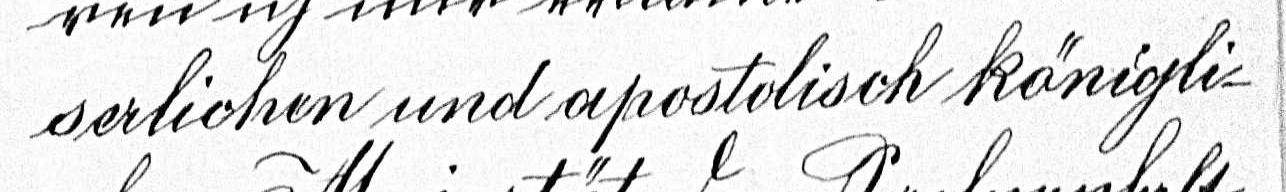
serlichen und apostolisch königli¬
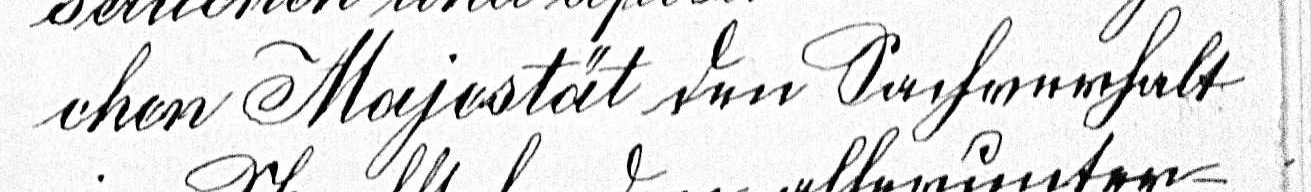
chen Majestät den Sachverhalt
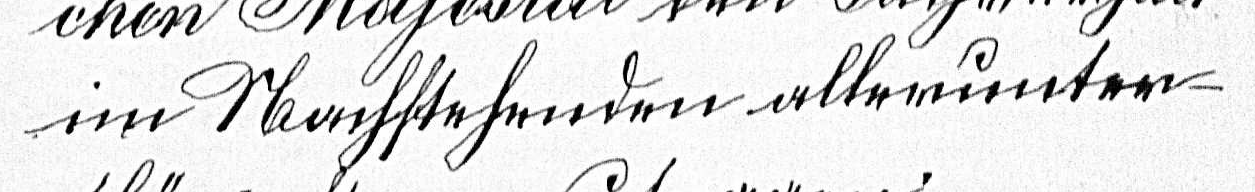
im Nachstehenden allerunter¬
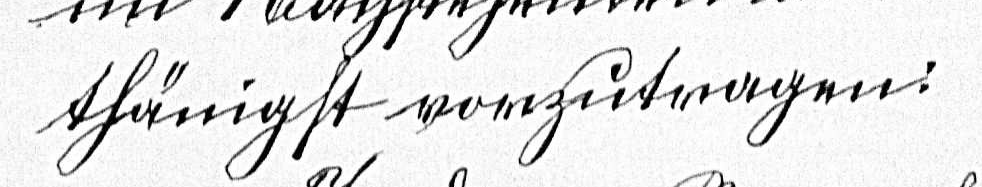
thänigst vorzutragen:
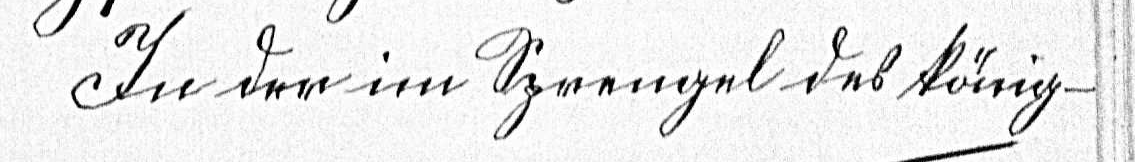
In der im Sprengel des könig¬
